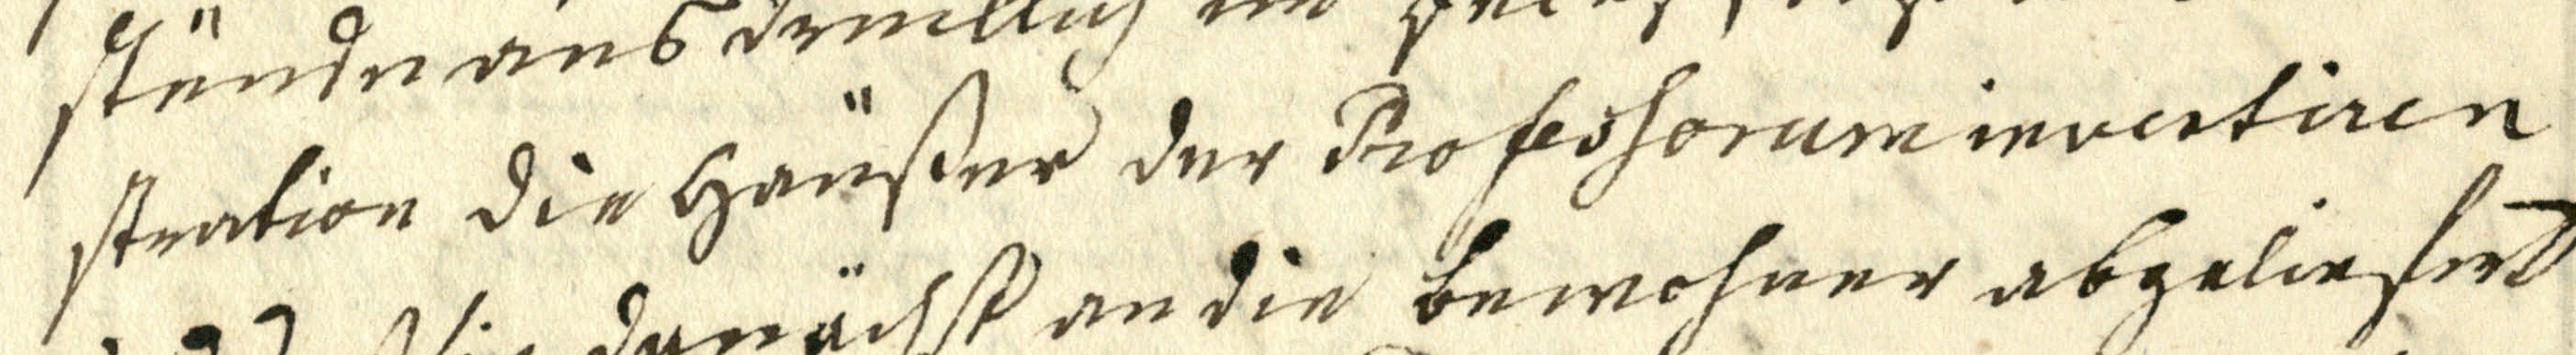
stration die Häußer der Professorum inventiren
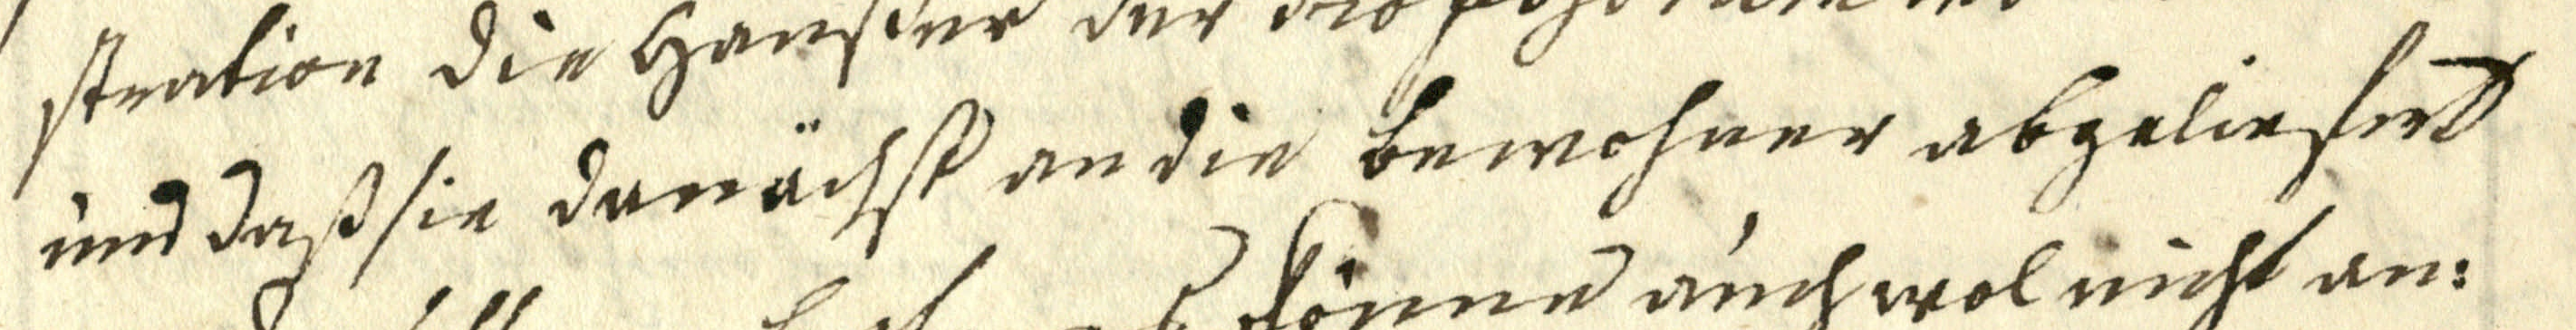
und daß sie danächst an die Bewohner abgeliefert
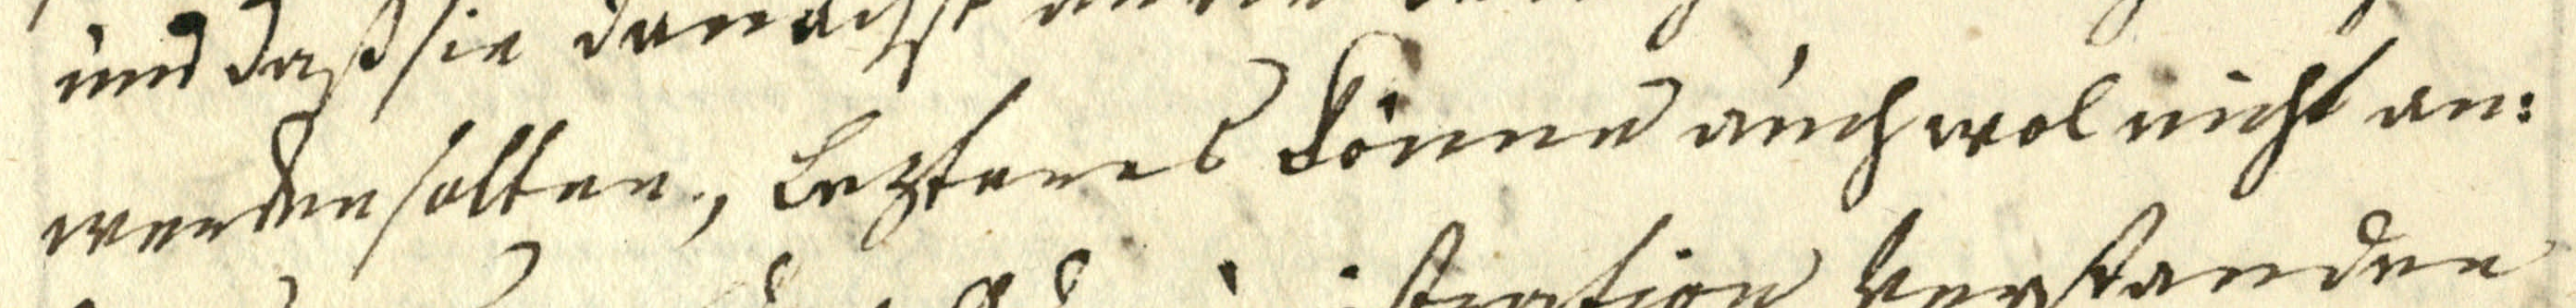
werden solten, lezteres könne auch wol nicht an¬
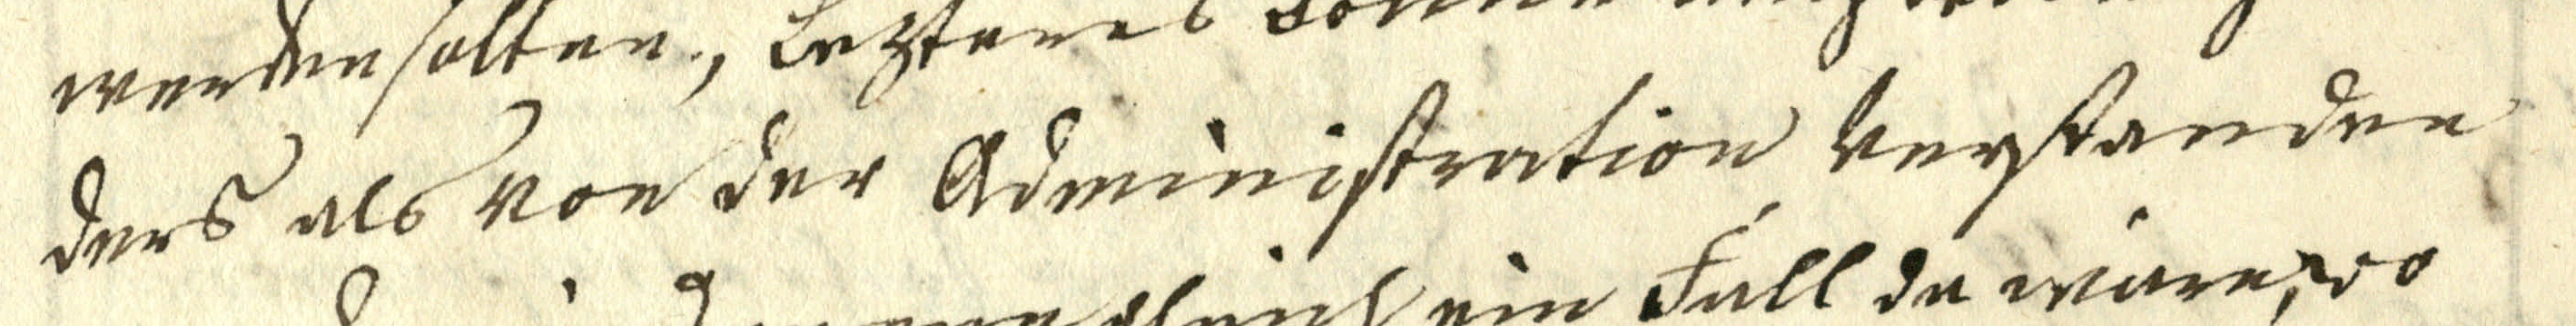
ders als von der Administration verstanden
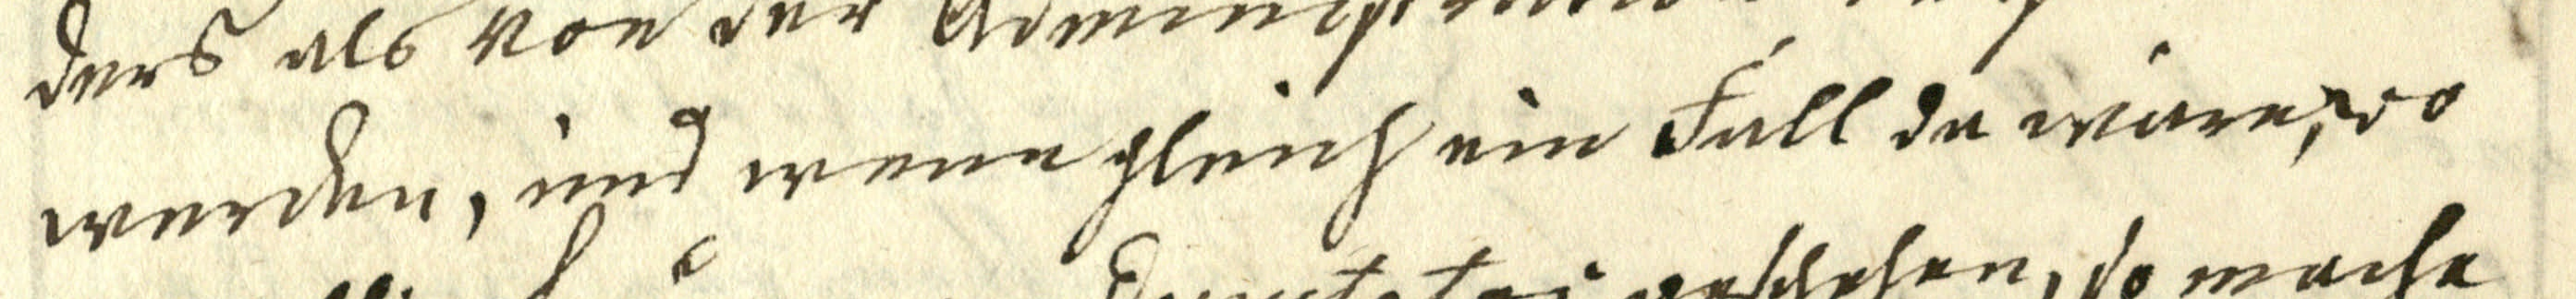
werden, und wenn gleich ein Fall da wäre,wo
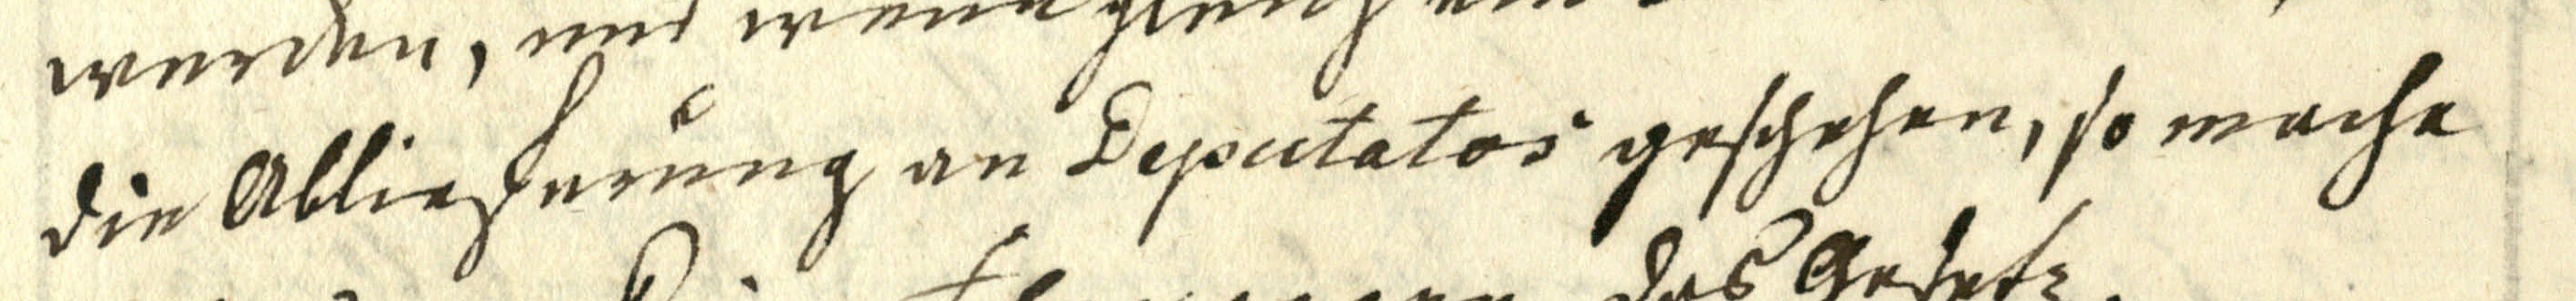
die Ablieferung an Deputatos geschehen, so mache
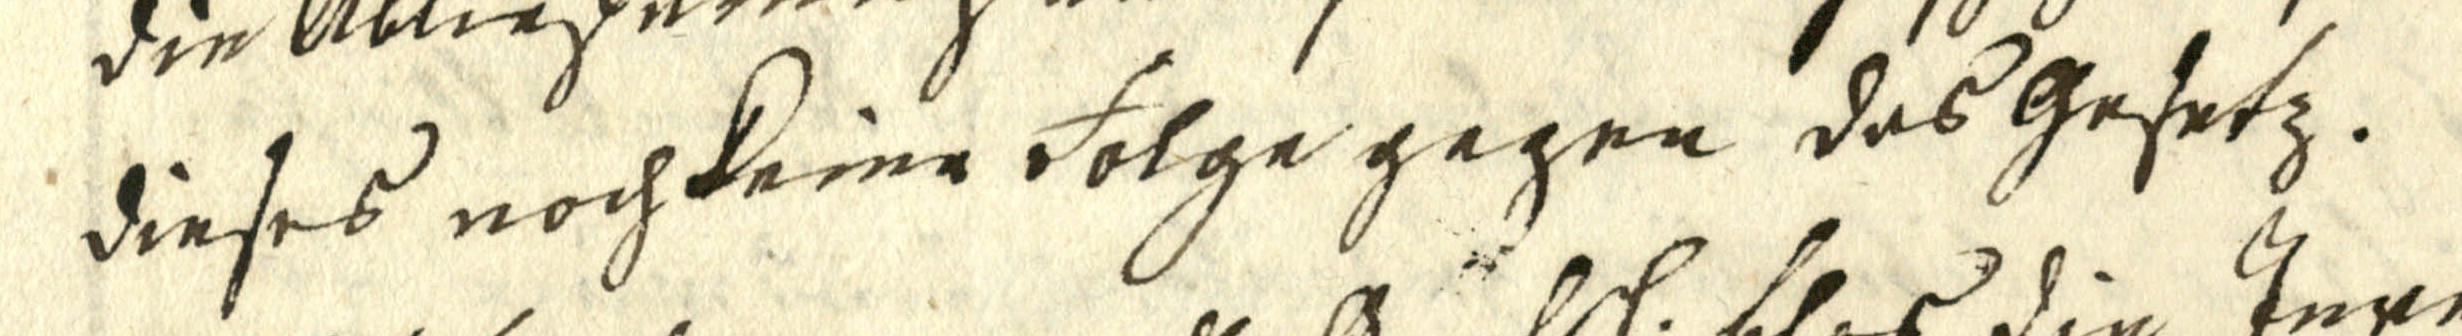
dieses noch keine Folge gegen das Gesetz.
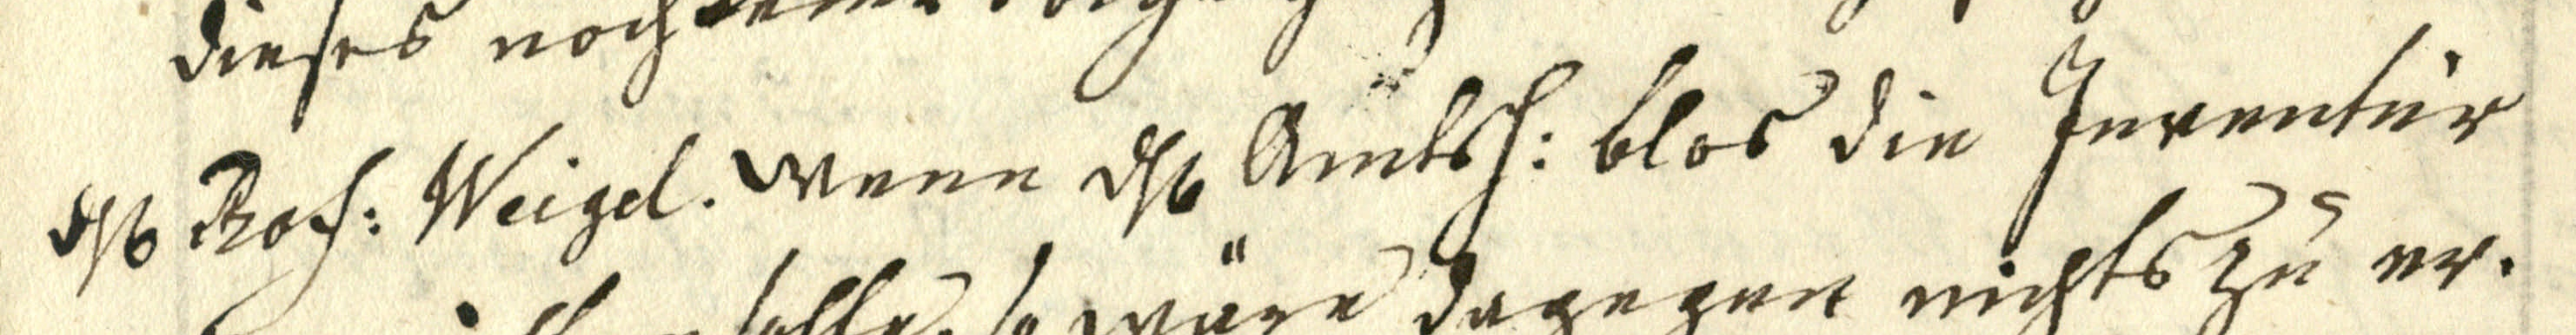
dh Prof. Weigel wenn dh. Amtsh. blos die Inventur
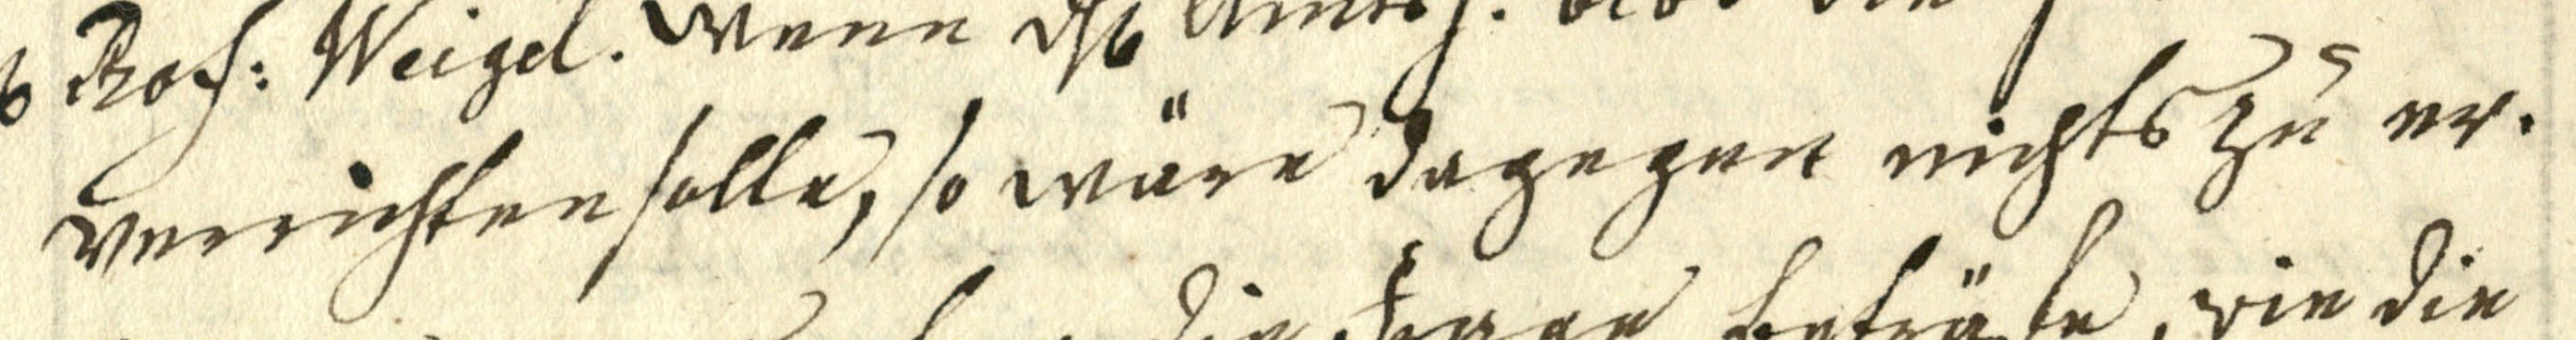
verrichten solle, so wäre dagegen nichts zu er¬
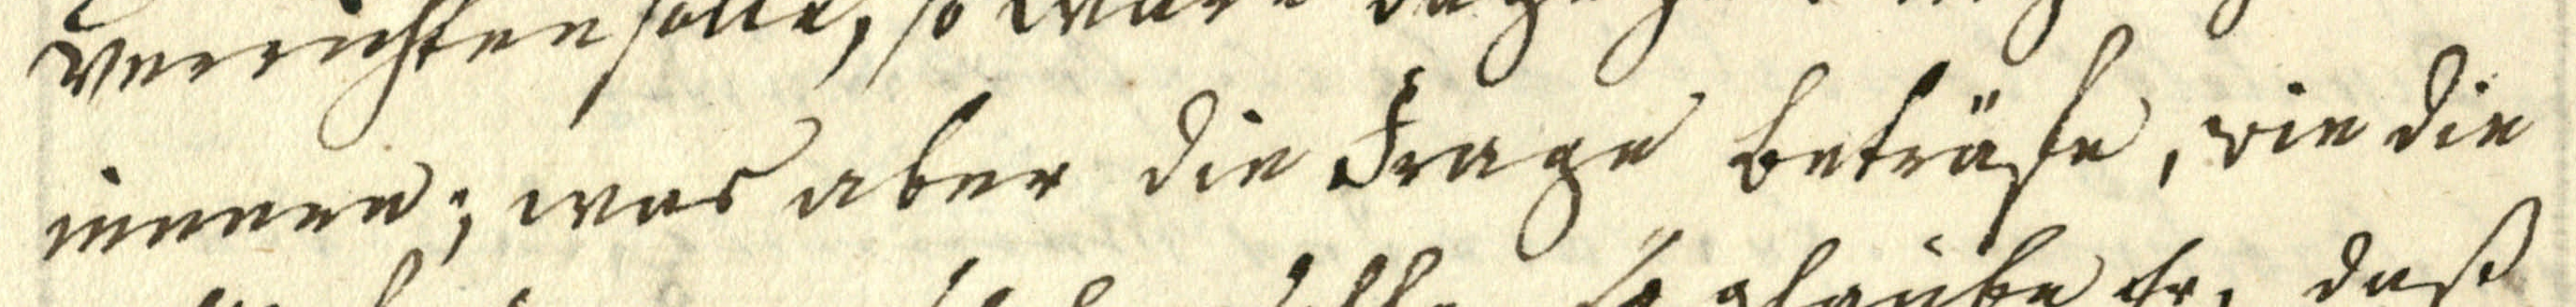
innern; was aber die Frage beträfe, wie die
